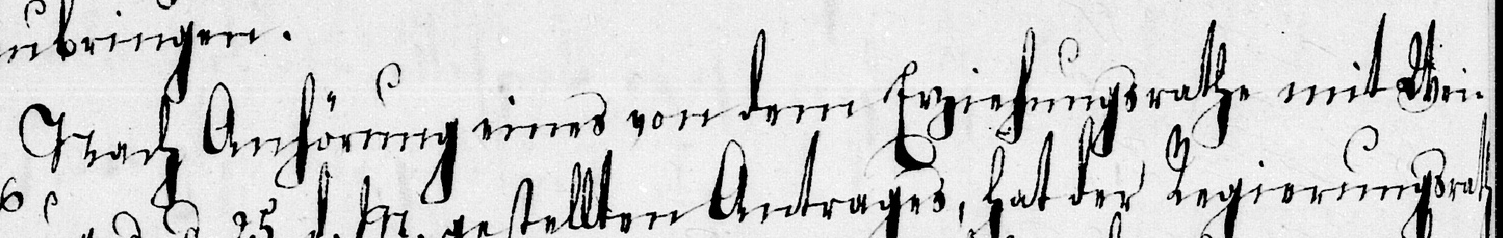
Nach Anhörung eines von dem Erziehungsrathe mit Wei¬
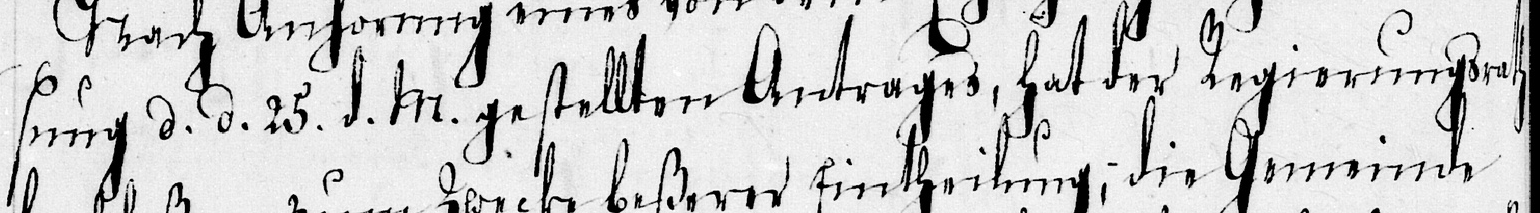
sung d. d. 25. d. M. gestellten Antrages, hat der Regierungsrath
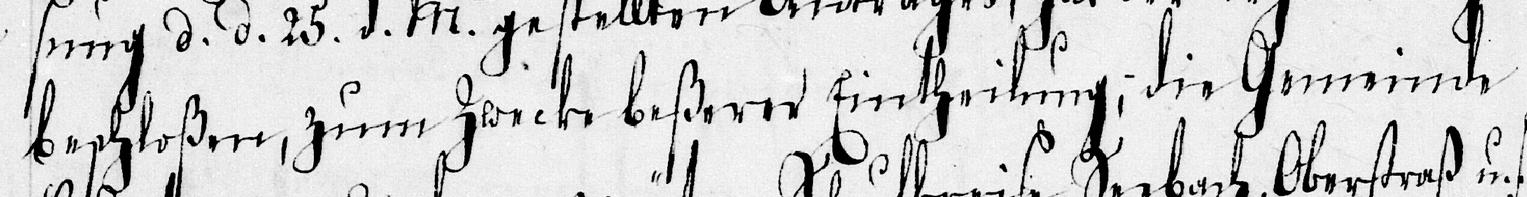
beschloßen, zum Zwecke beßerer Eintheilung, die Gemeinde
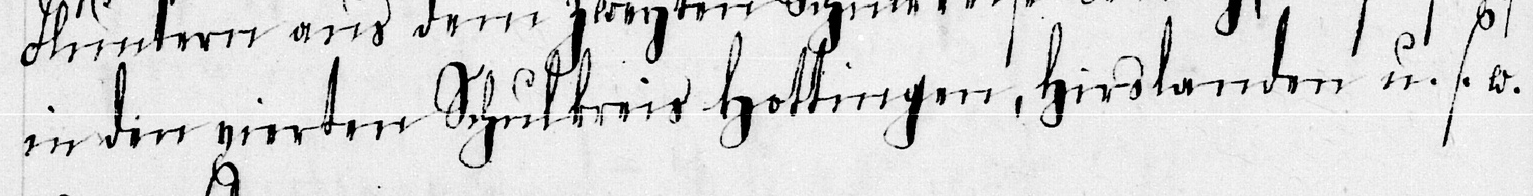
in den vierten Schulkreis Hottingen, Hirslanden u.s.w.
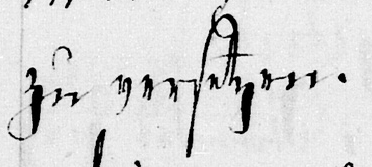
zu versetzen.
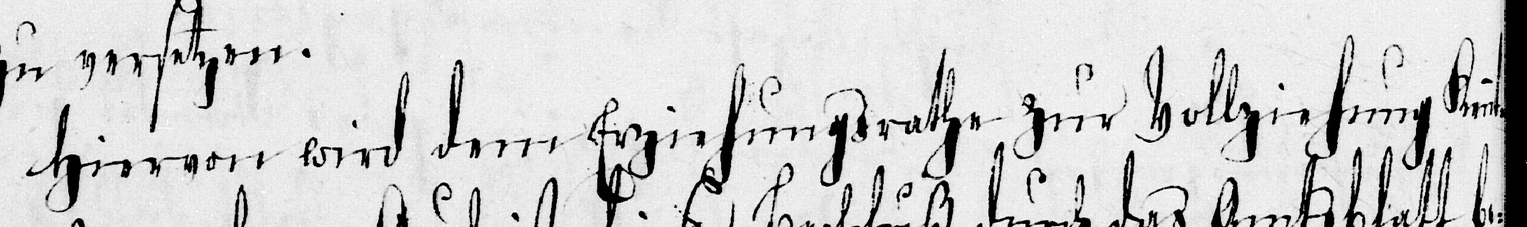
Hiervon wird dem Erziehungsrathe zur Vollziehung Ken¬
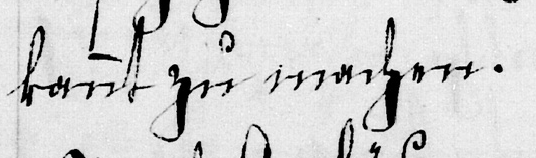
kannt zu machen.
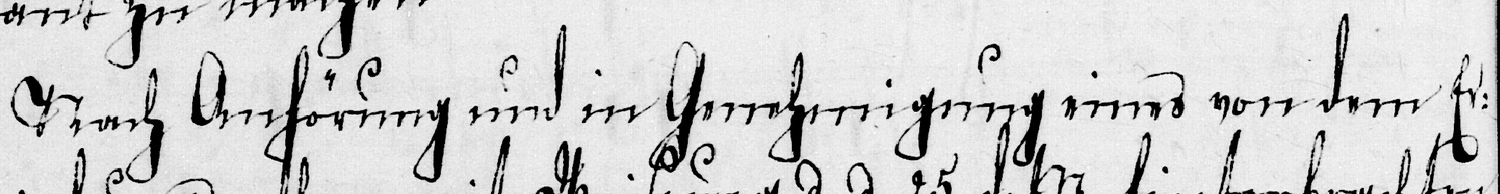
Nach Anhörung und in Genehmigung eines von dem Er¬
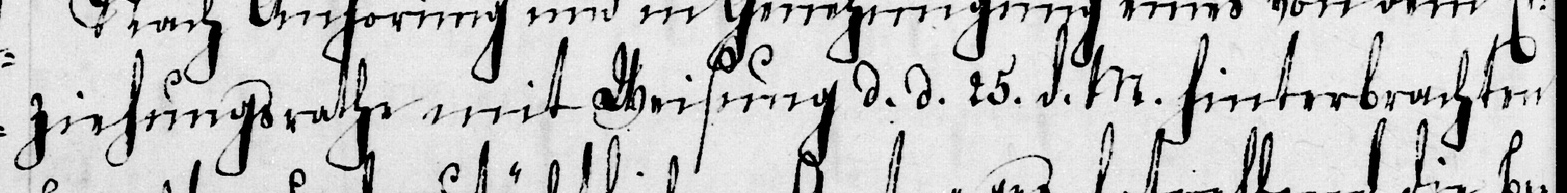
ziehungsrathe mit Weisung d. d. 25. d. M. hinterbrachten
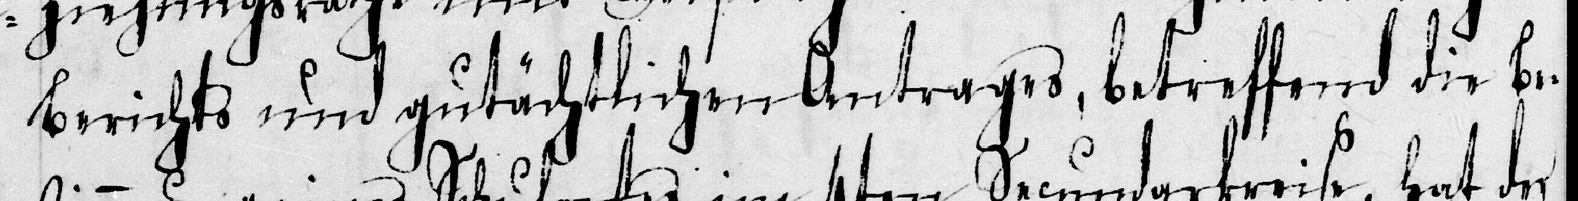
Berichts und gutächtlichen Antrages, betreffend die Be¬
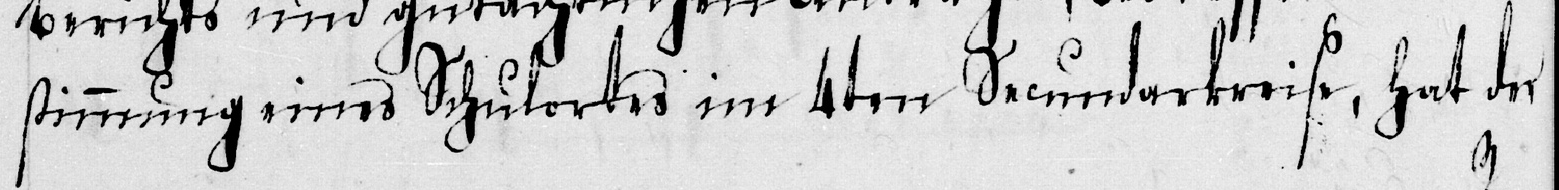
stimmung eines Schulortes im 4ten Secundarkreise, hat der
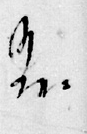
be¬
